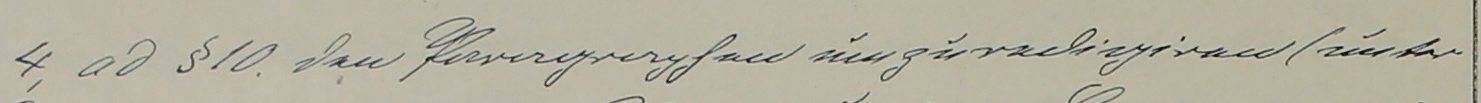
4. ad § 10. den Paragraphen umzuredigiren (unter
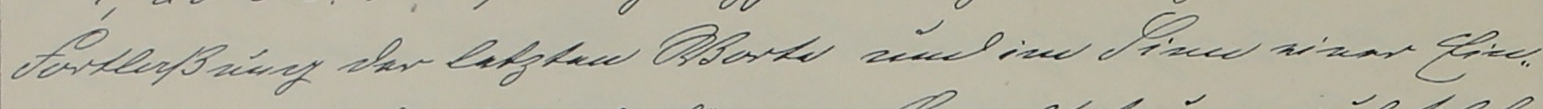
Fortlaßung der letzten Worte und im Sinn einer Ein-
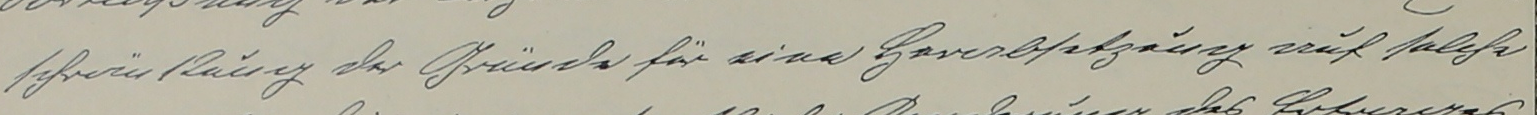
schränkung der Gründe für eine Herabsetzung auf solche
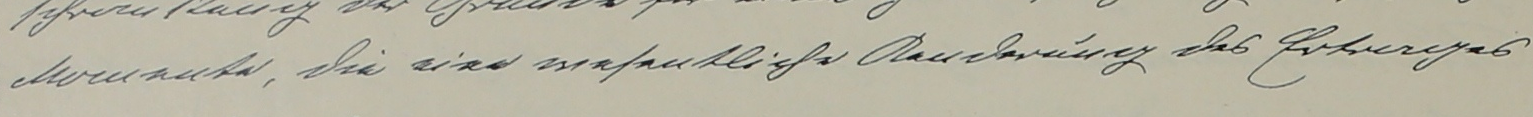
Momente, die eine wesentliche Aenderung des Ertrages
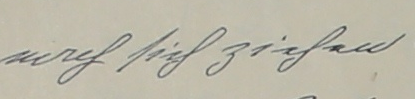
nach sich ziehen.
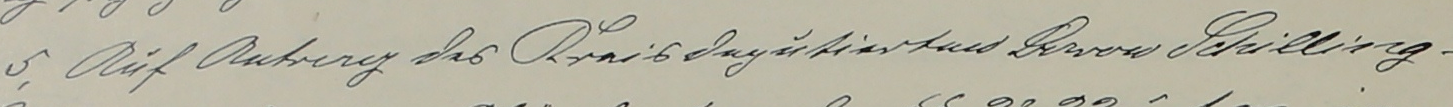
5. Auf Antrag des Kreisdeputierten Baron Schilling-
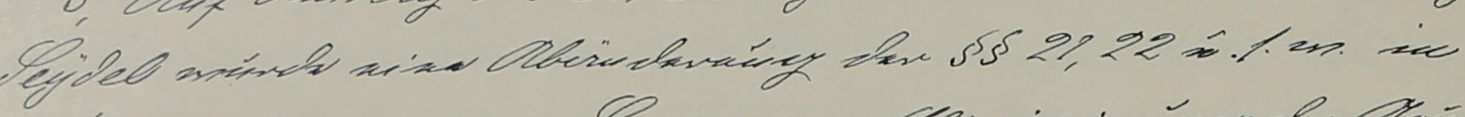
Seydel wurde eine Abänderung der §§ 21, 22 u.s.w. in
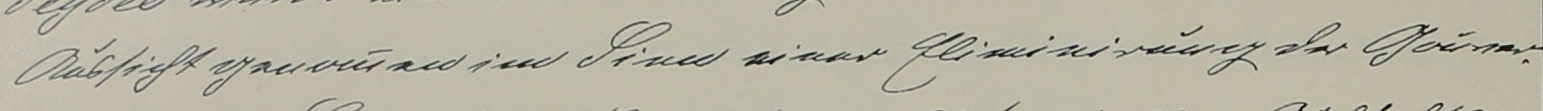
Aussicht genommen im Sinn einer Eliminirung der Gouver-
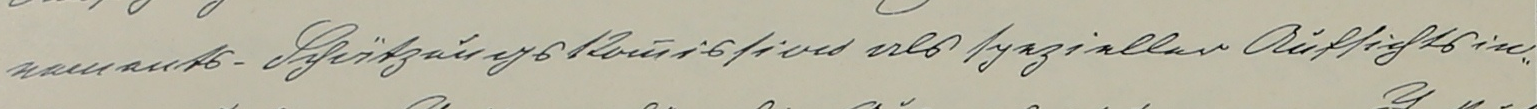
nements-Schätzungskommission als spezieller Aufsichtsin-
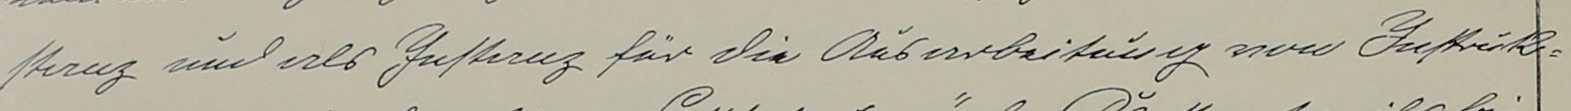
stanz und als Instanz für die Ausarbeitung von Instruk-
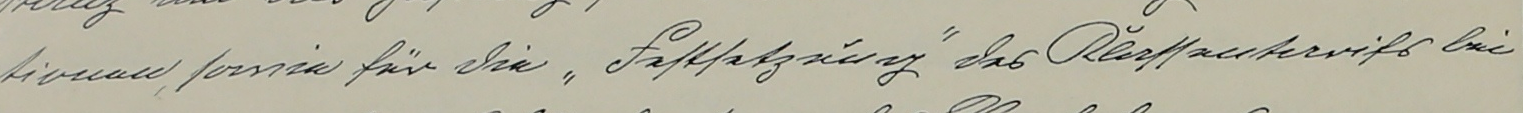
tionen, sowie für die „Festsetzung“ des Klassentarifs bei
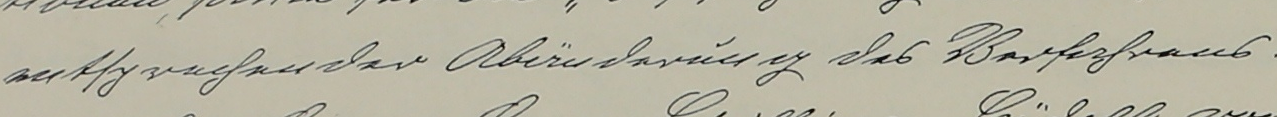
entsprechender Abänderung des Verfahrens.
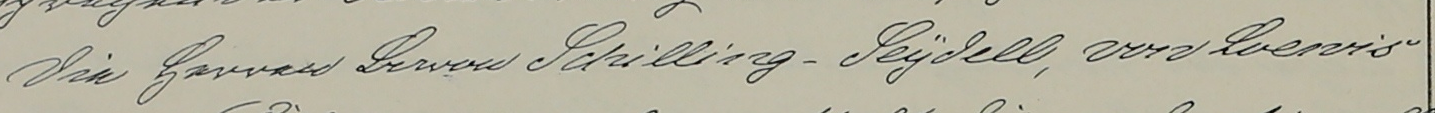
Die Herren Baron Schilling-Seydell, von Loewis
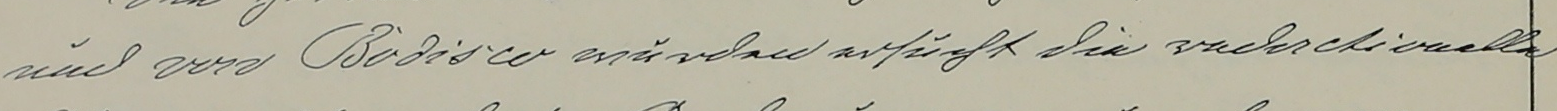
und von Bodisco wurden ersucht die redactionelle
